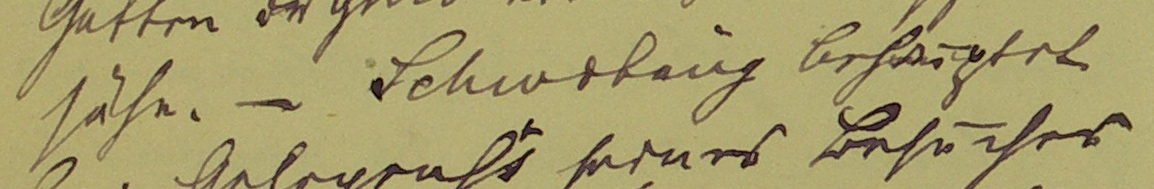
sähe.- Schwiburg behauptet
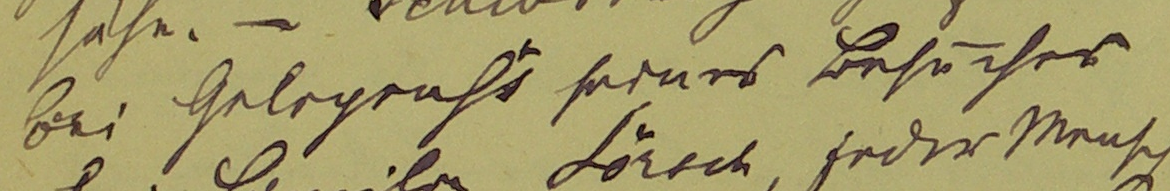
bei Gelegenheit seines Besuches
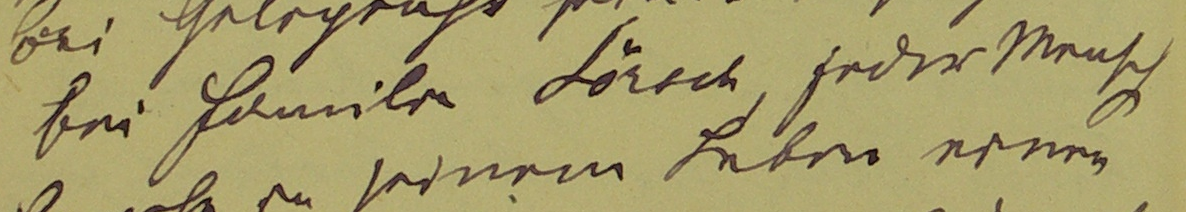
bei Familie Lörsch, jeder Mensch
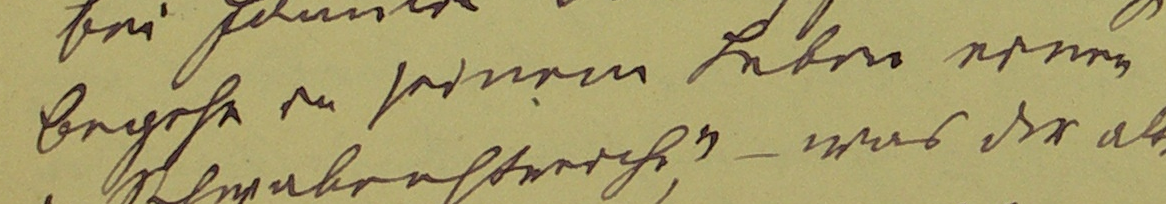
begehe in seinem Leben einen
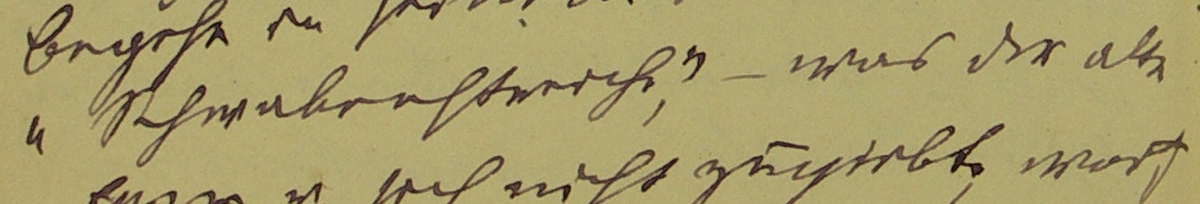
„ Schwabenstreich“, was der alte
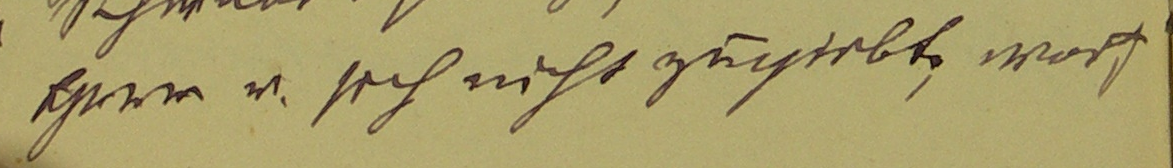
Herr von sich nicht zugibt, worauf
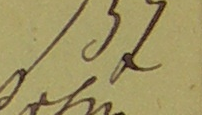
137
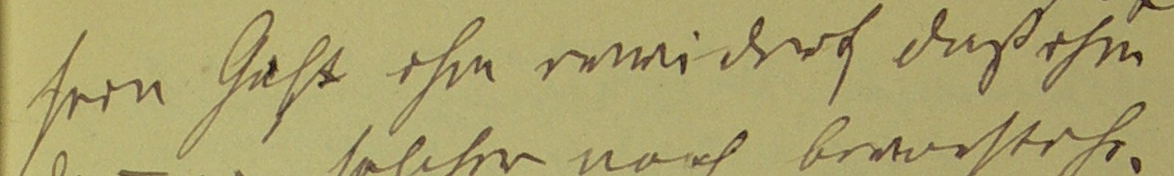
sein Gast ihm erwiderte daß ihm
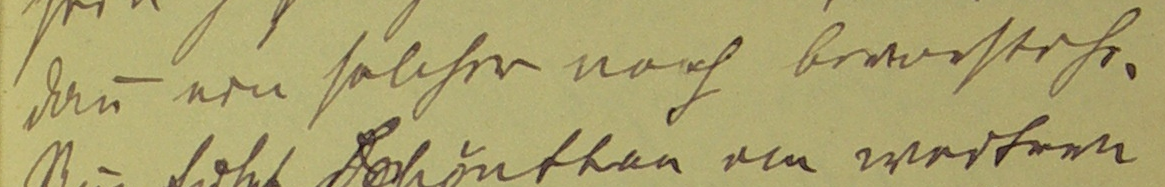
dann ein solcher noch bevorstehe.
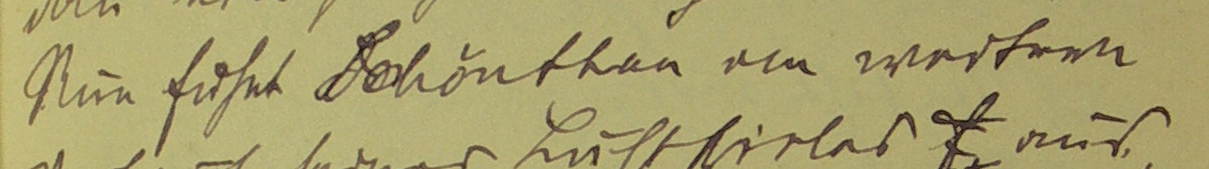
Nun führt Schönthan im weiteren
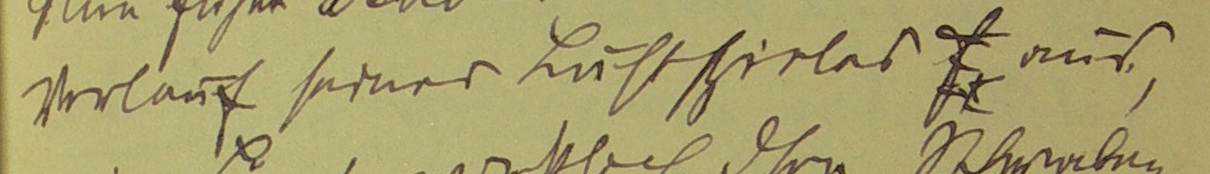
Verlauf seines Lustspiels mit aus
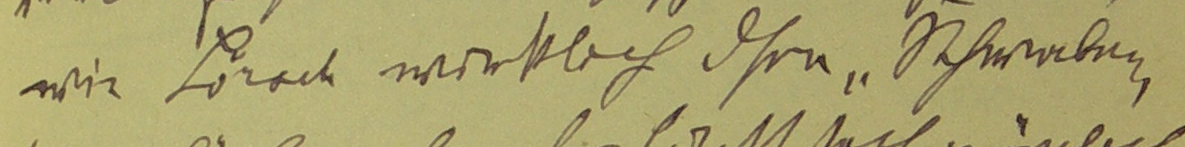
wie Lörsch wirklich den „Schwaben¬
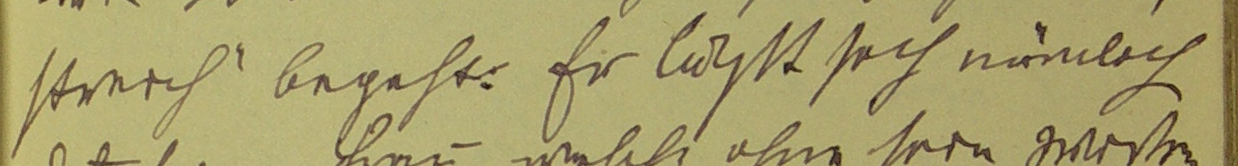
streich“ begeht. Er läßt sich nämlich
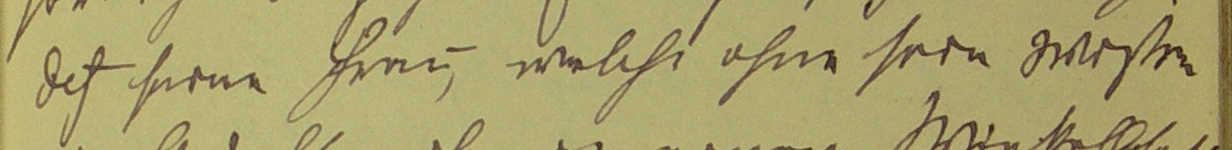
durch seine Frau, welche ohne sein Wissen,
